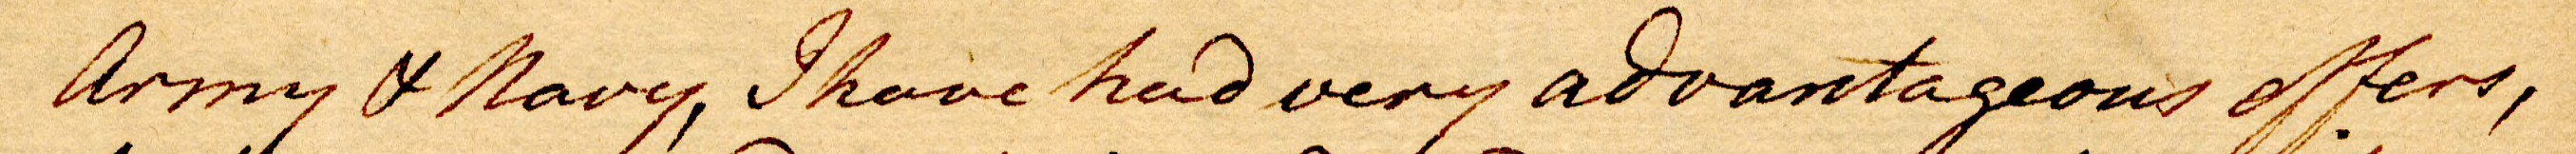Army & Navy, I have had very advantageous offers,
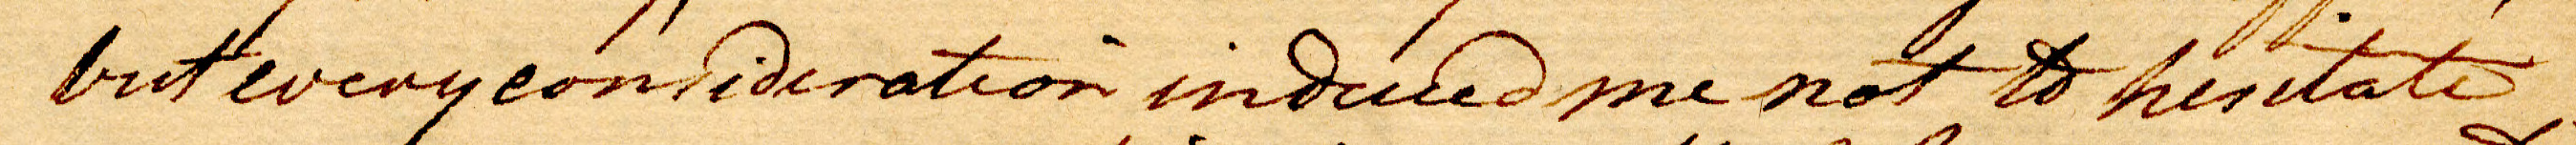but every consideration induced me not to hesitate
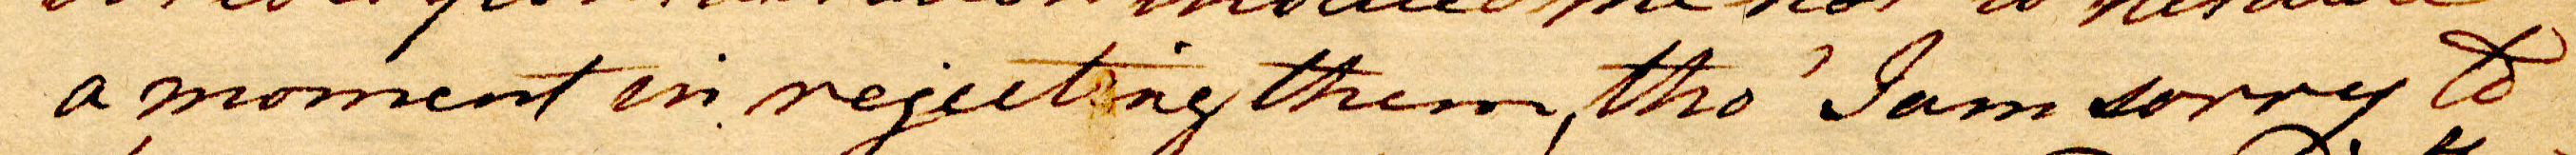a moment in neglecting them, tho' I am sorry to
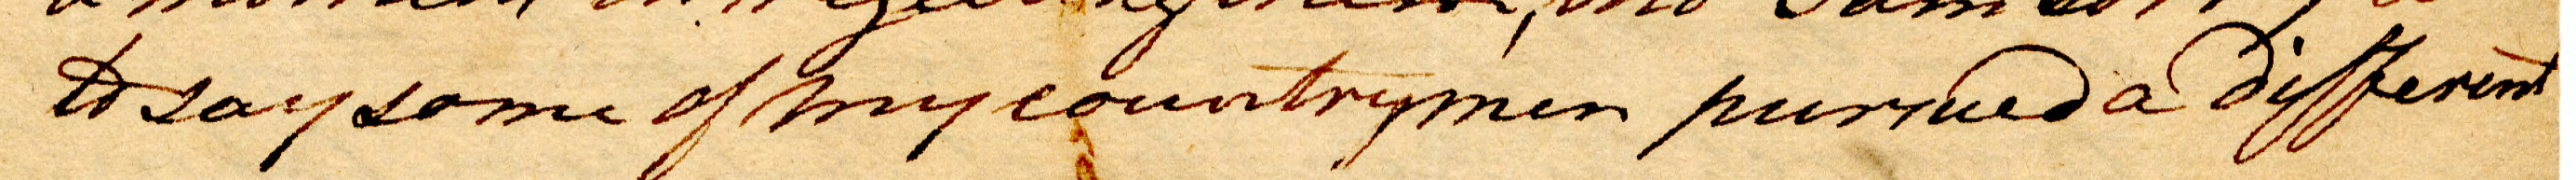to say some of my countrymen pursued a different
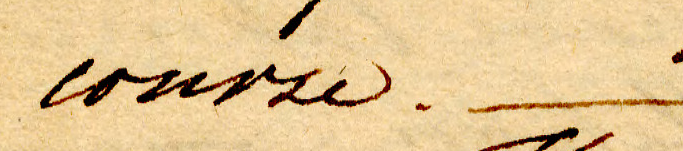course.-
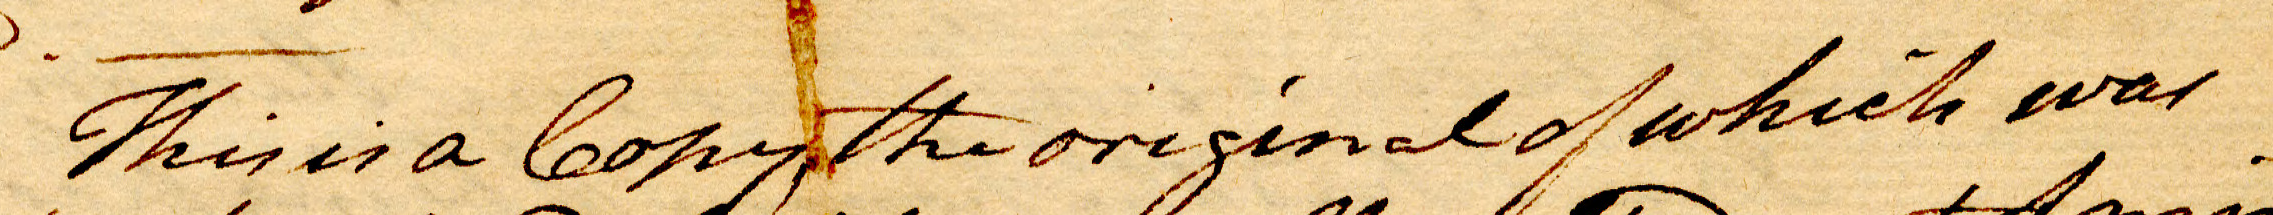This is a Copy, the original of which was
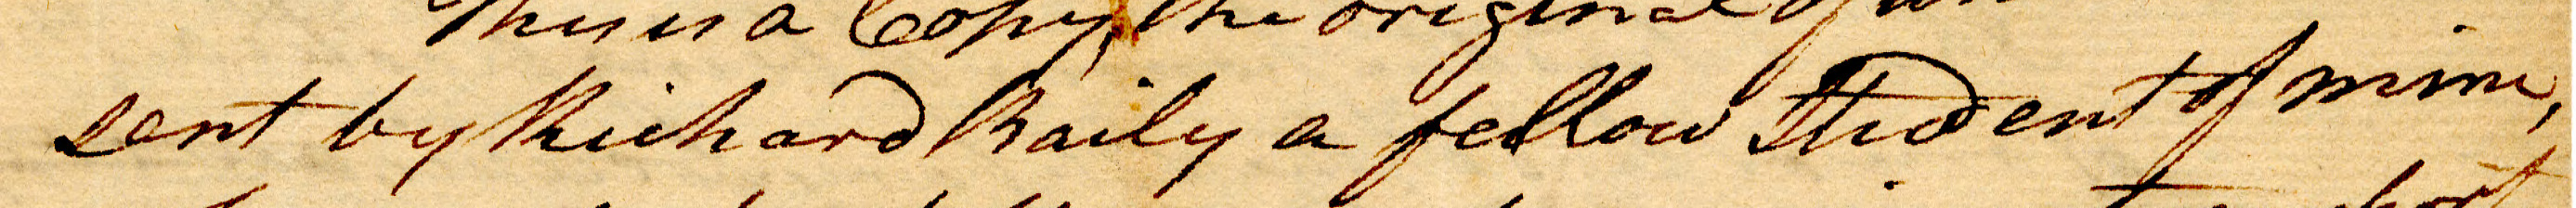sent by Richard Baily, a fellow student of mine,
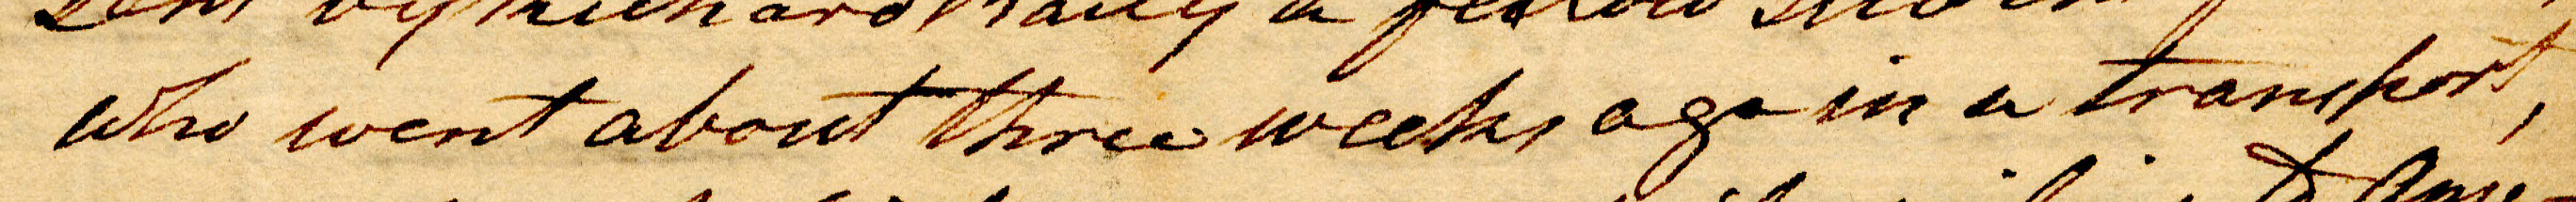who went about three weeks ago in a transport,
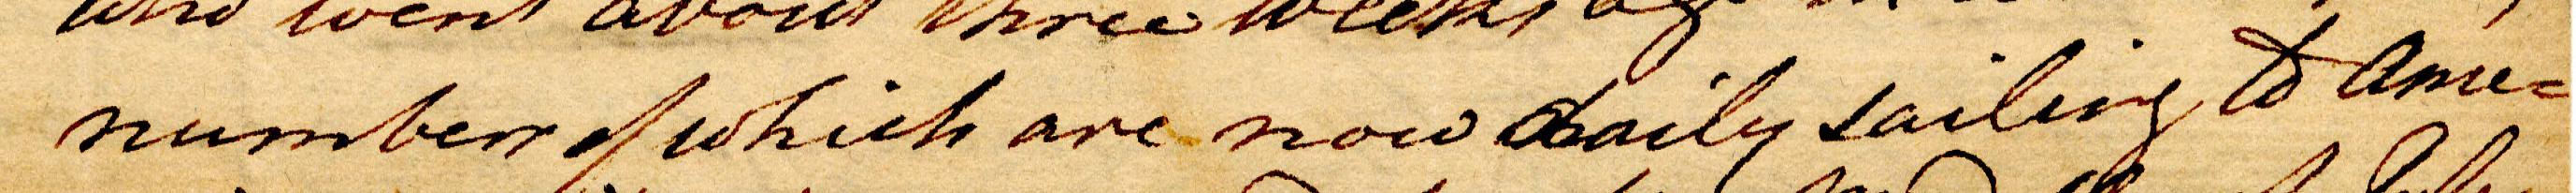numbers of which are now daily sailing to Ame-
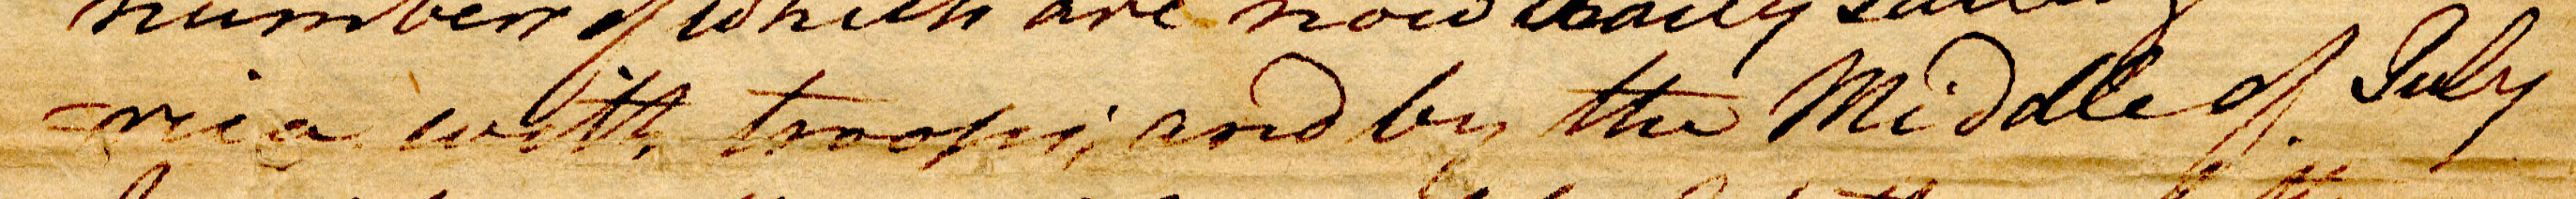-rica with troops; and by the Middle of July
